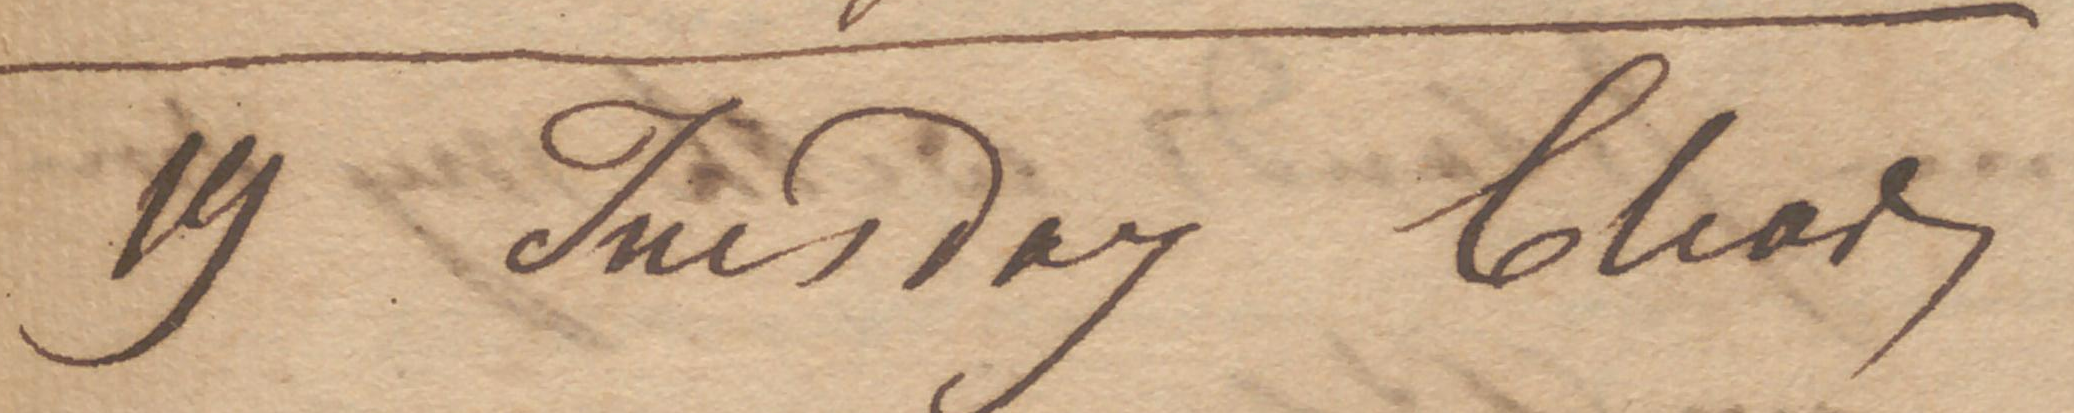19 Tuesday Clear
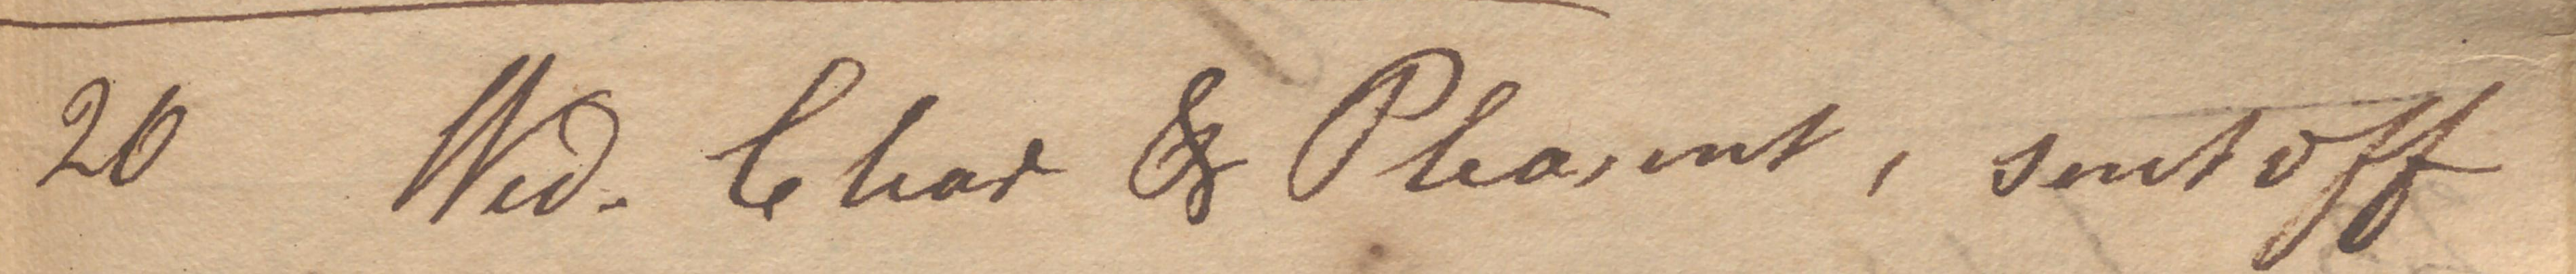20 Wed. Clear & Pleasent, sent off
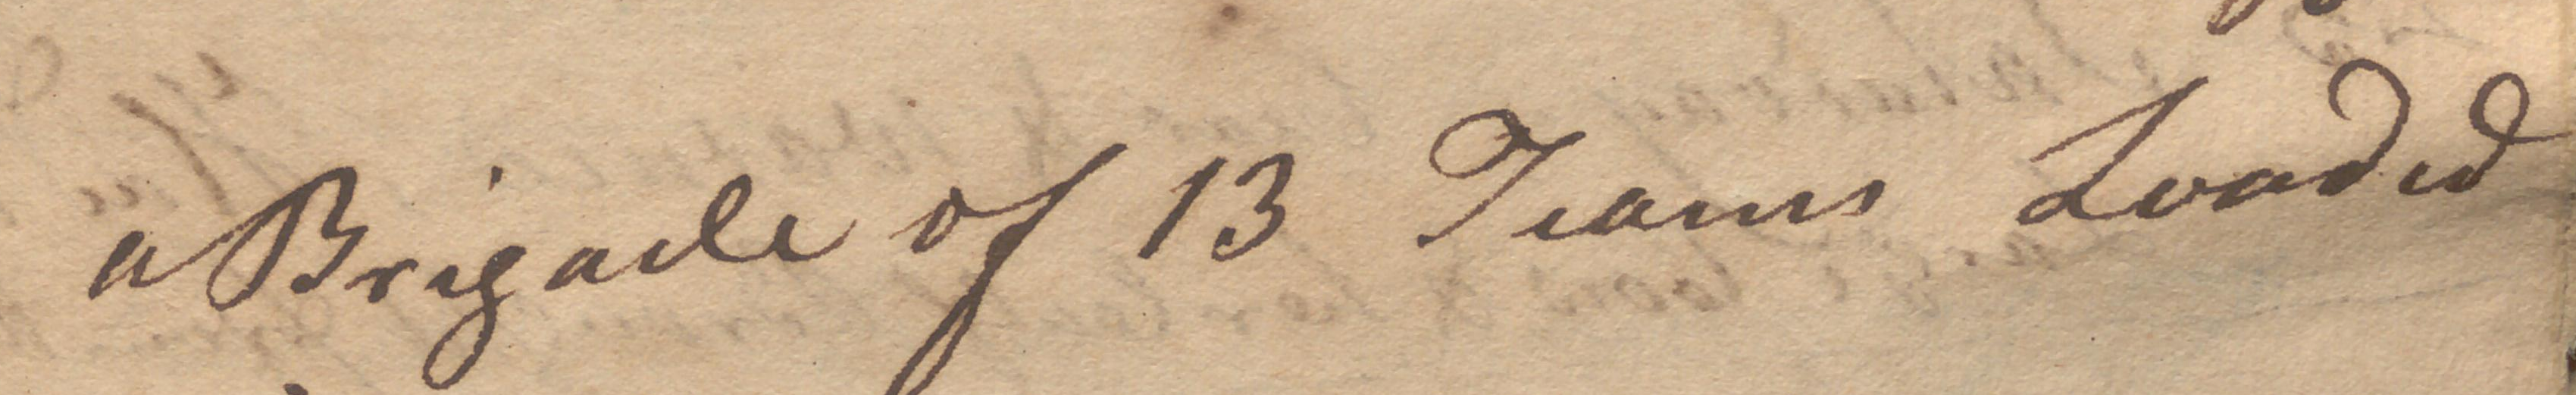a Brigade of 13 Teams Loaded
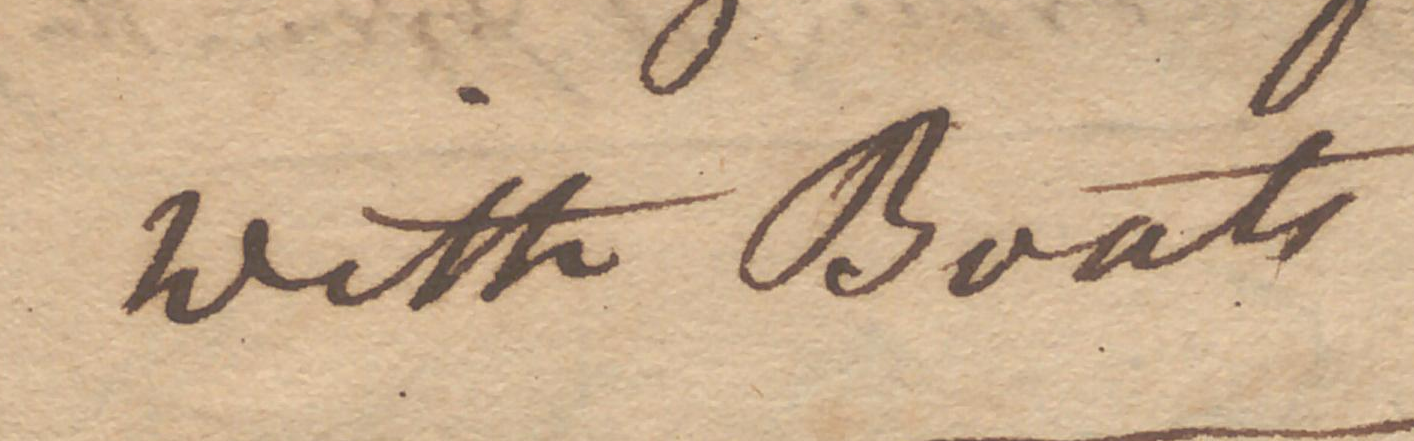with Boats
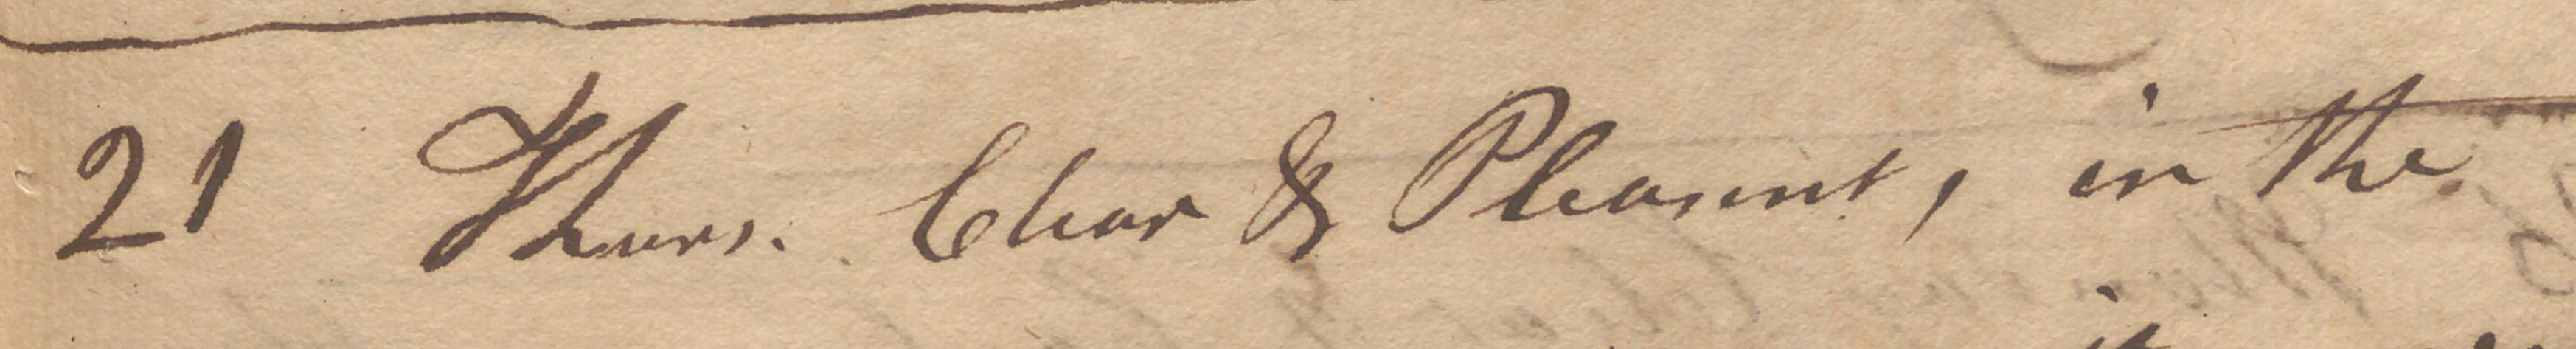21 Thurs. Clear & Pleasent, in the
